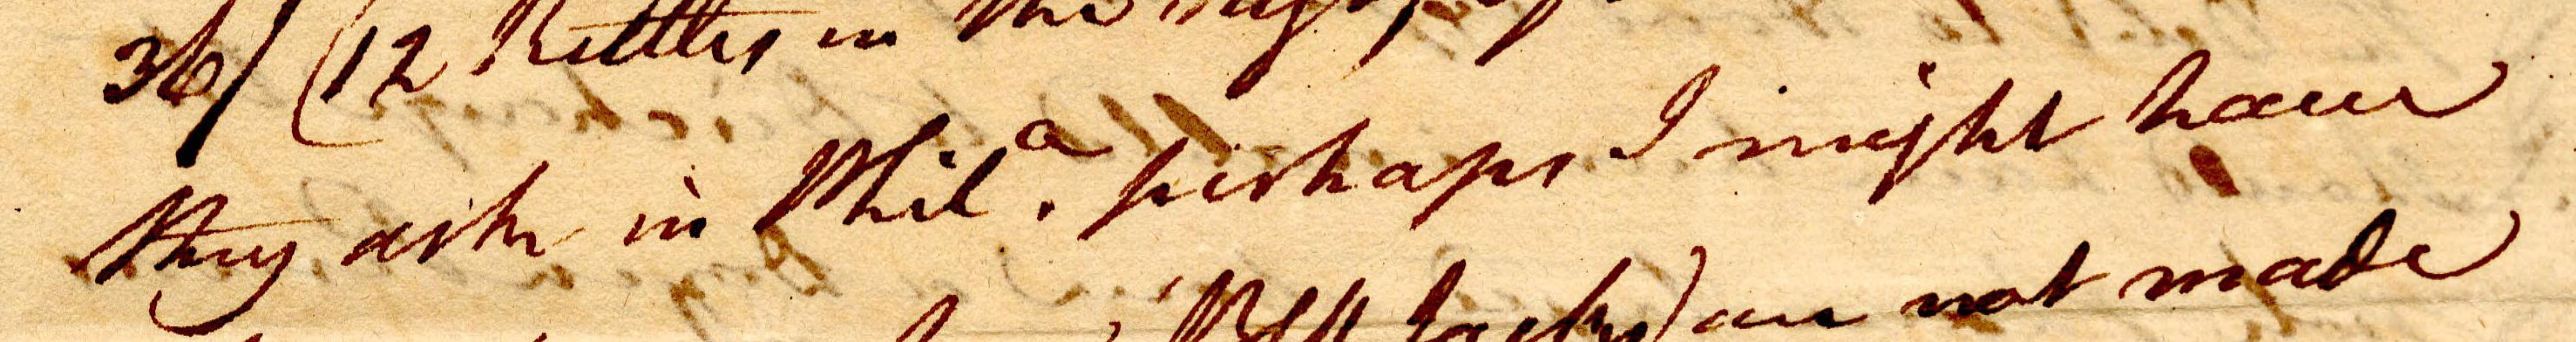they ask in Phil^a perhaps I might have
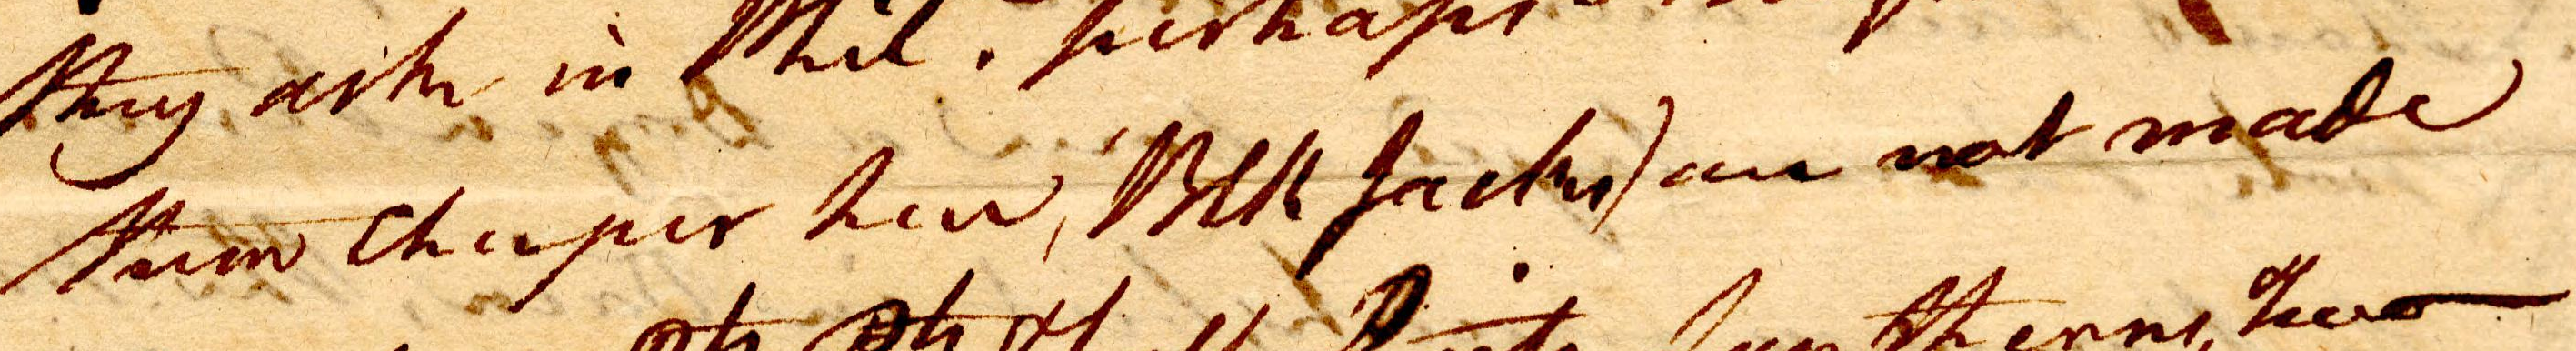them Cheaper here [___] Jack) are not made
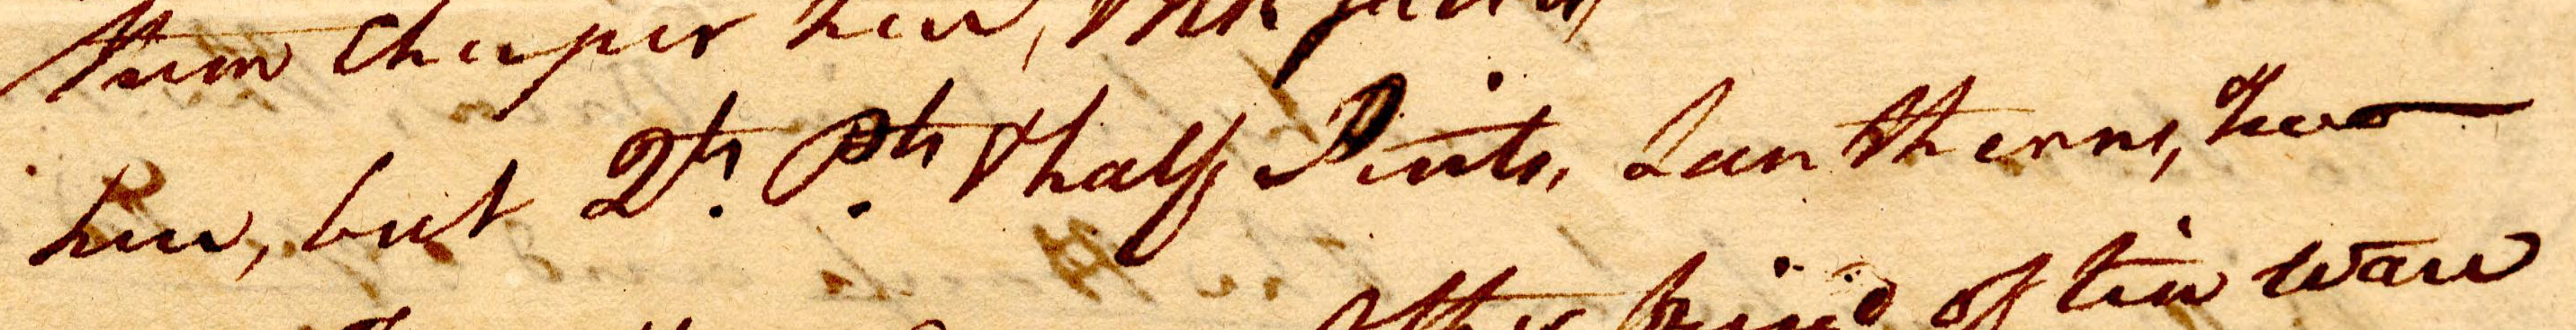there, but 2^t. ph. per half Pints, Lanterns, two
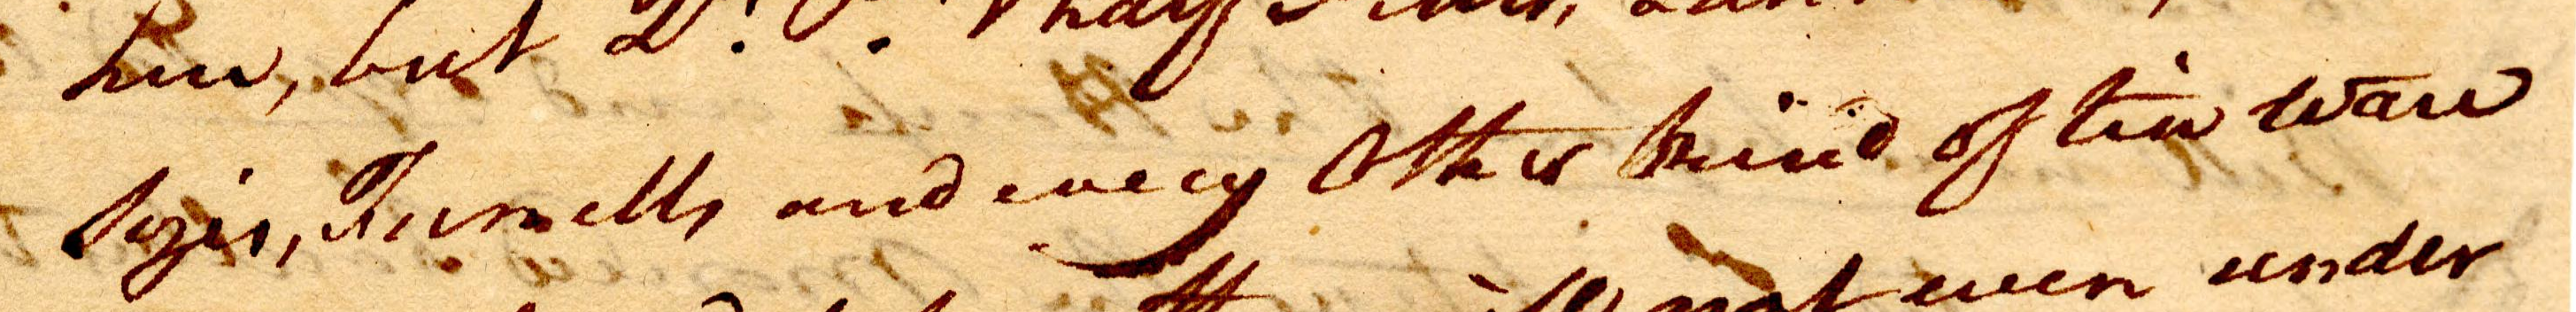Sizes, Funells and every Other kind of tin ware
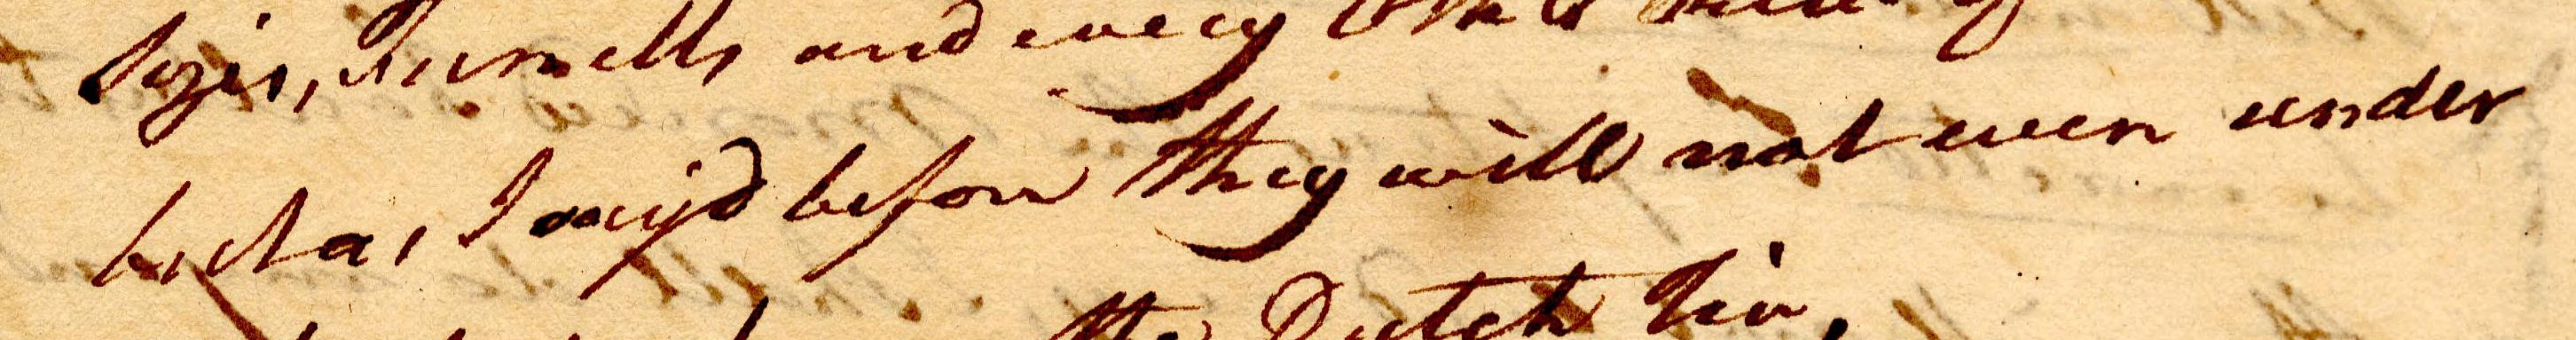but as I aqu'd before they will not seen under-
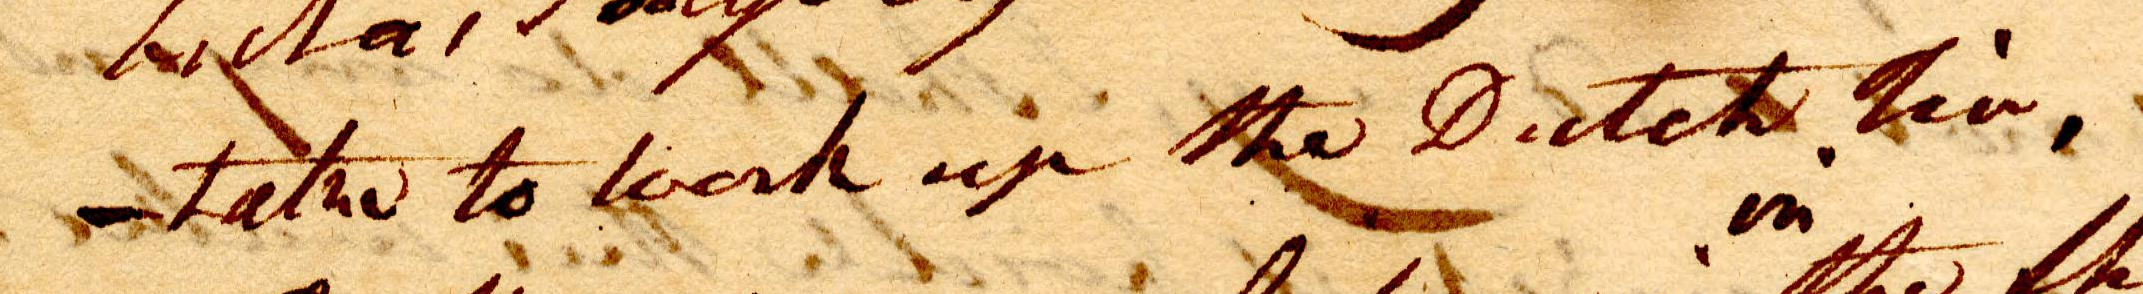-take to work up the Dutch Tin,
